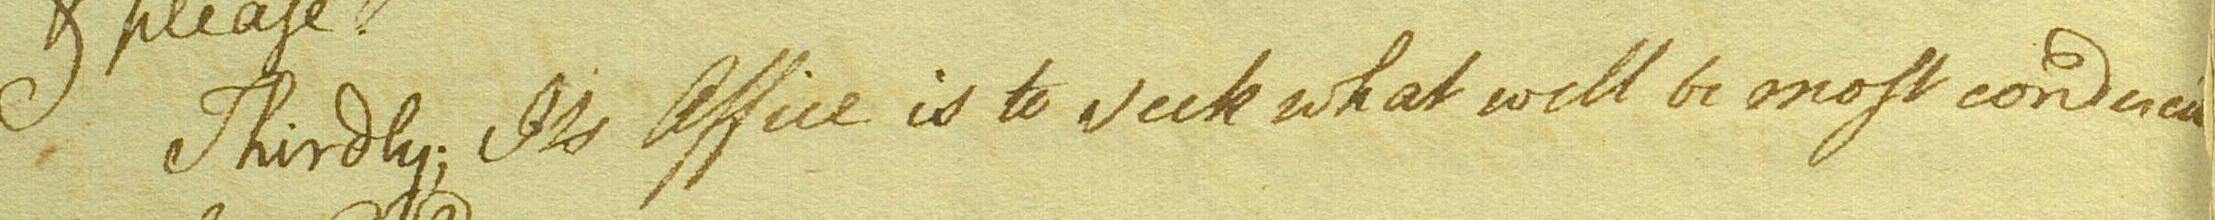Thirdly; Its Office is to seek what will be most conducive
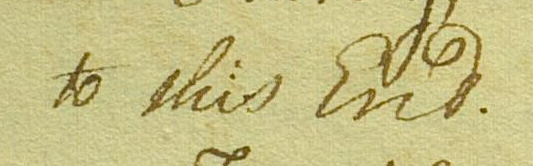to this End.
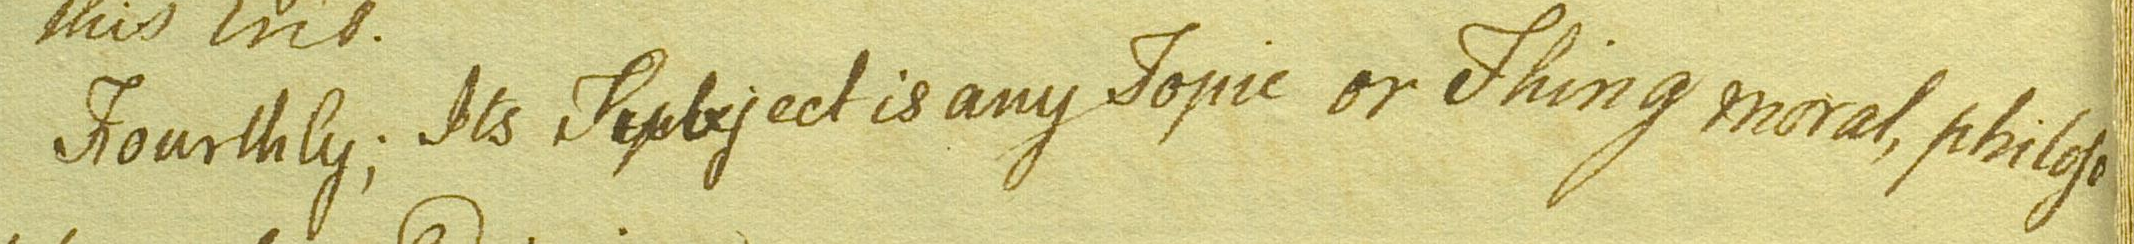Fourthly; Its Subject is any Topic or Thing Moral, philoso
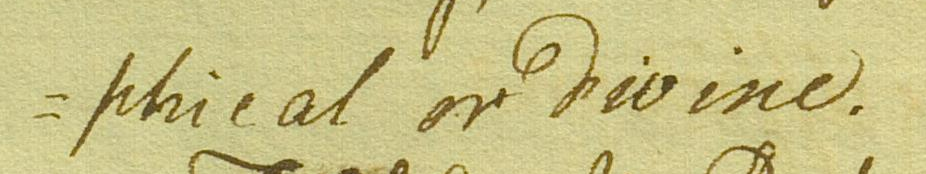-phical or divine.
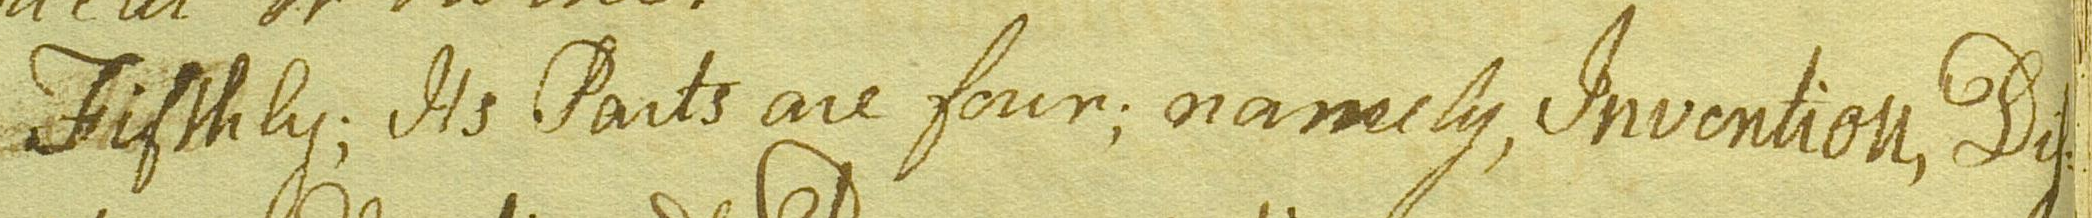Fifthly; Its Parts are four; namely, Invention, Dis-
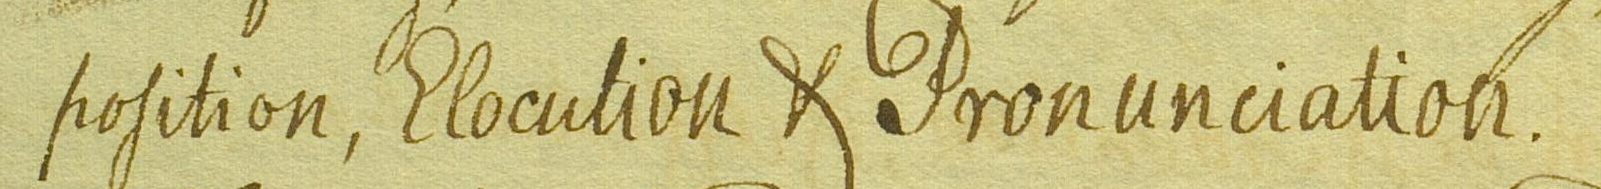position, Elocution & Pronunciation.
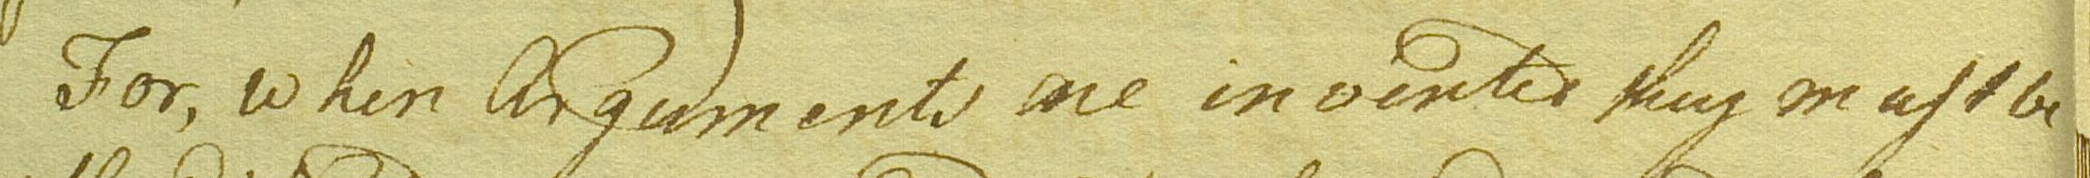For, when Arguments are invented they must be
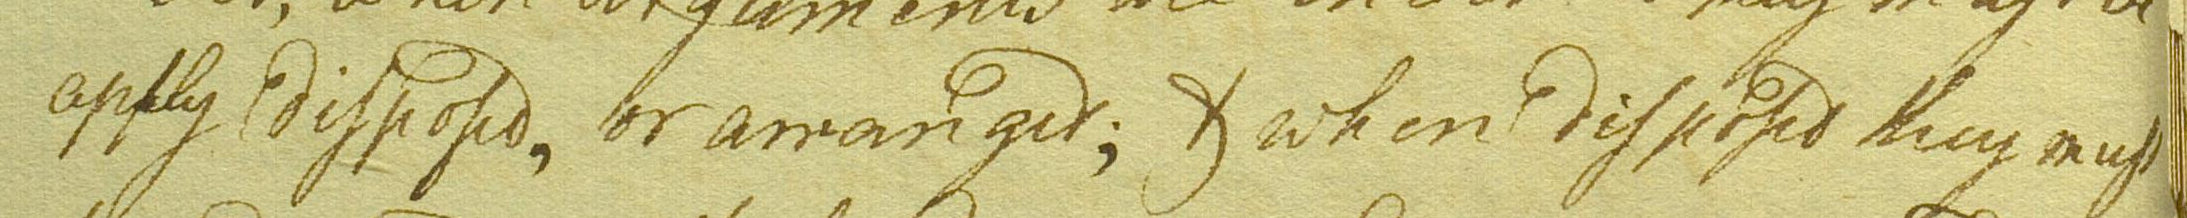aptly disposed, or arranged; & when disposed they must
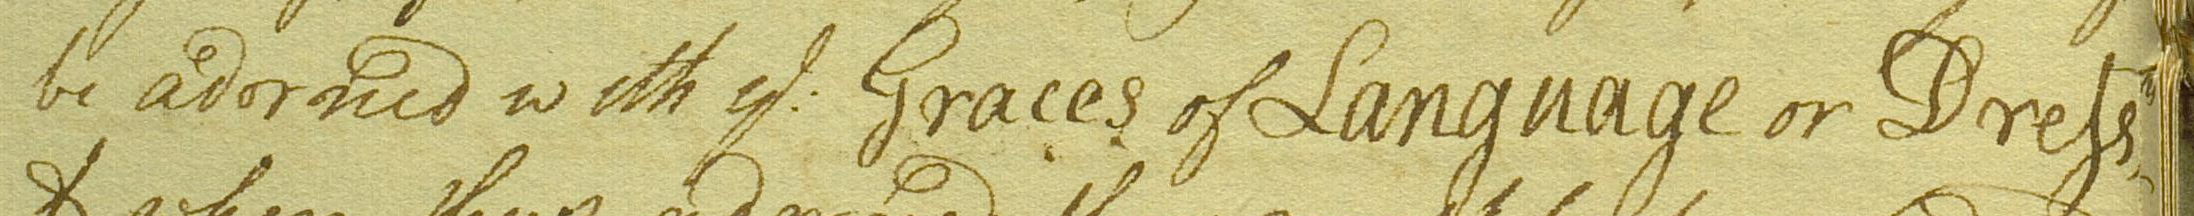be adorned with y^e Graces of Language or Dress
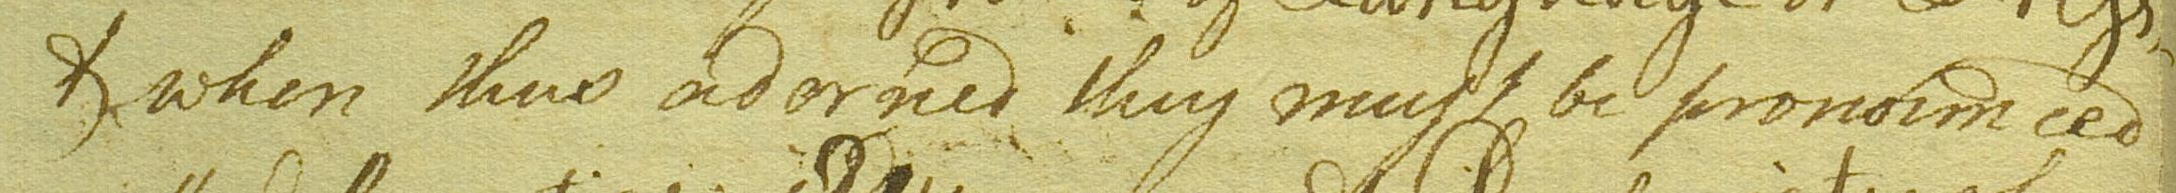& when thus adorned they must be pronounced
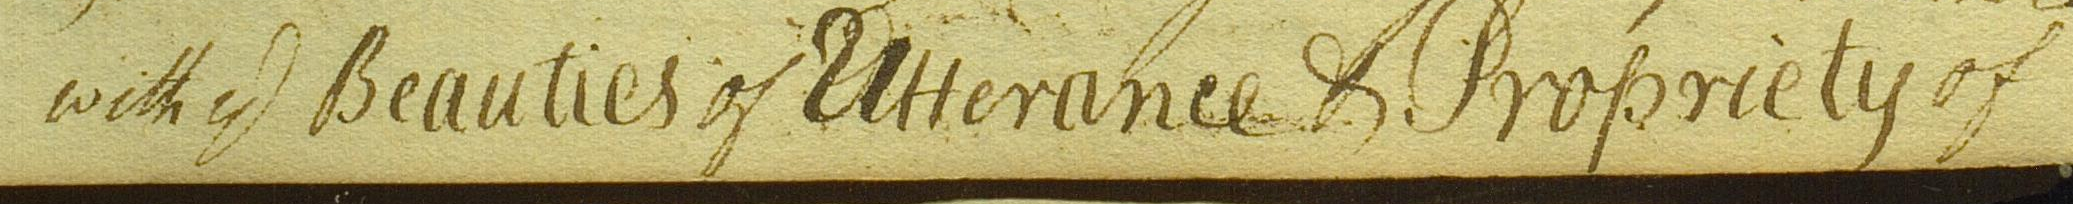with y^e Beauties of Utterance & Propriety of
